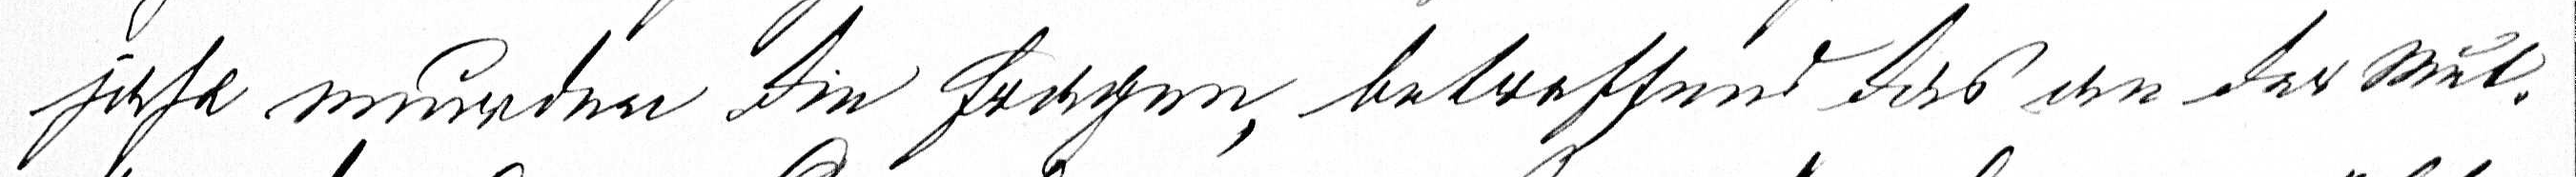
jaht wurden die Fragen, betreffend das an der Mut¬
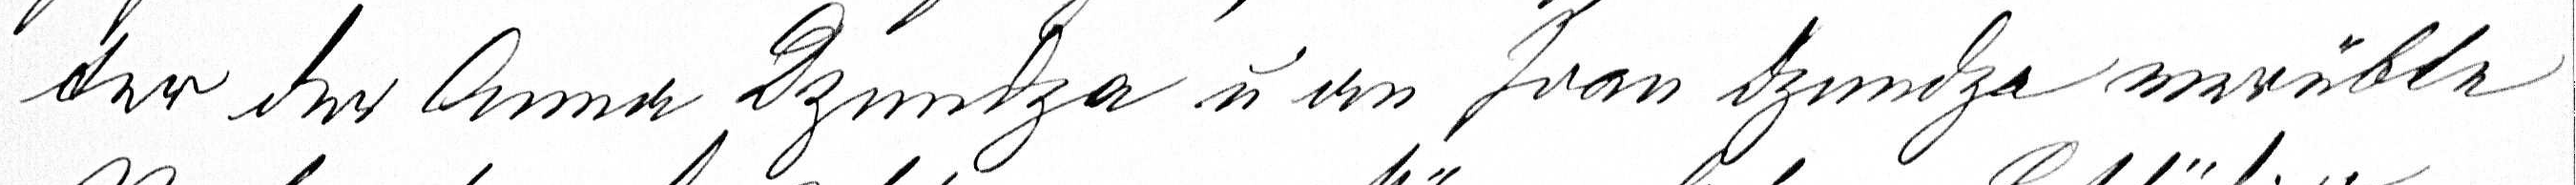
ter der Anna Dzendza u an Ivan Dzendza verübte
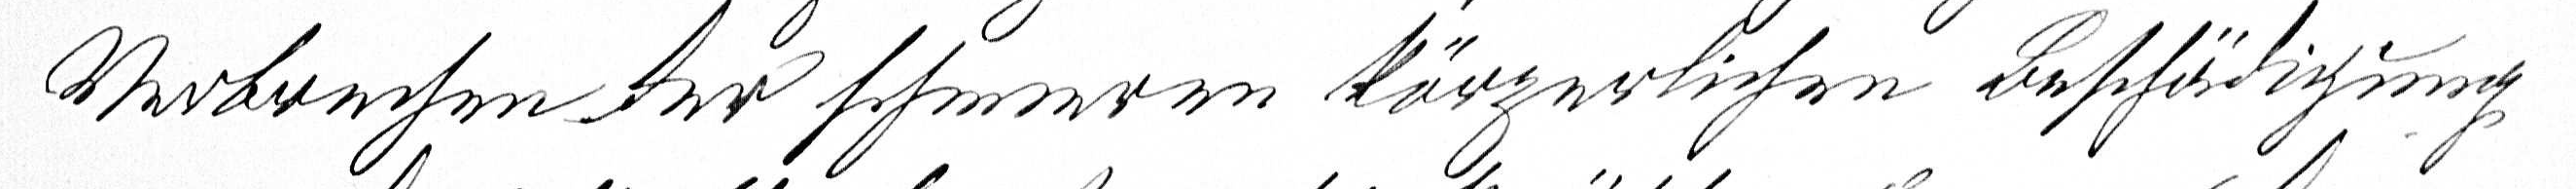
Verbrechen der schweren Körperlichen Beschädigung.
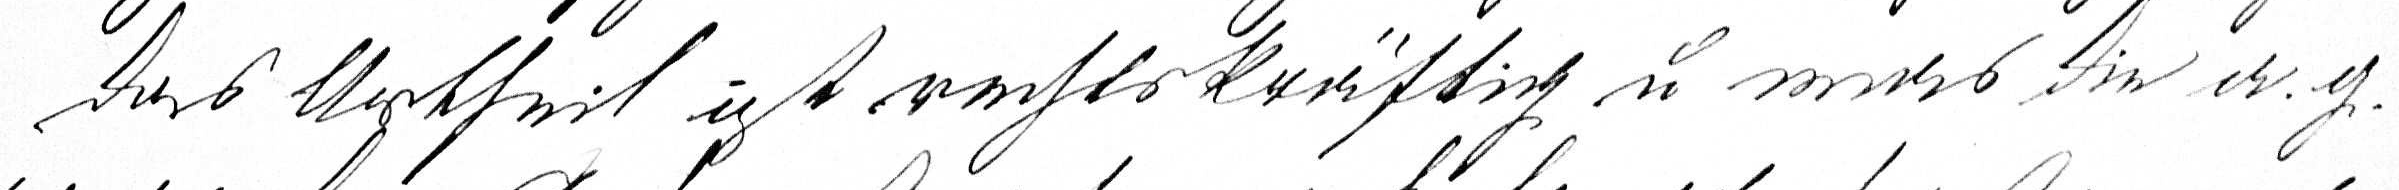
Das Urtheil ist rechtskräftig u was die a.g.
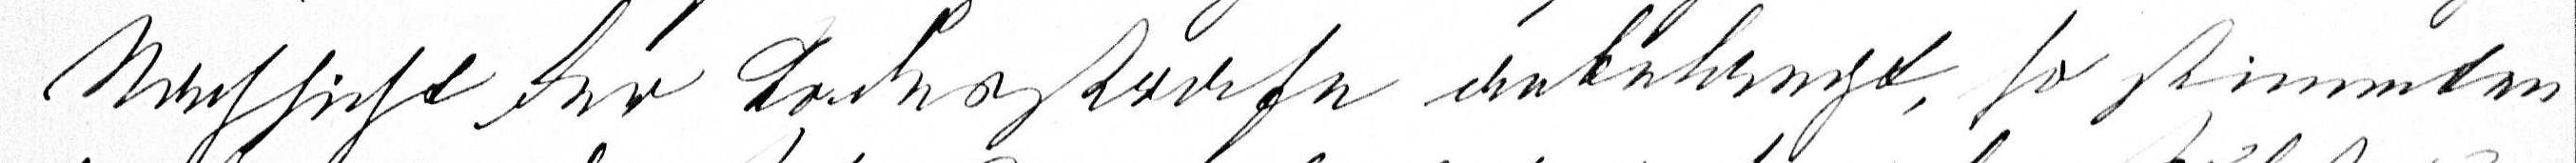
Nachsicht er Todesstrafe anbelangt, so stimmten
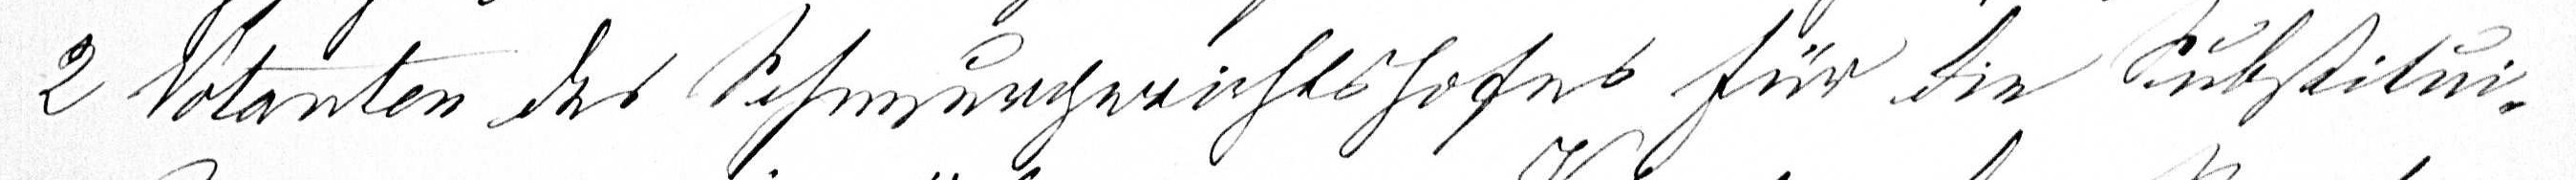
2 Votanten des Schwurgerichtshofes für die Substitui¬
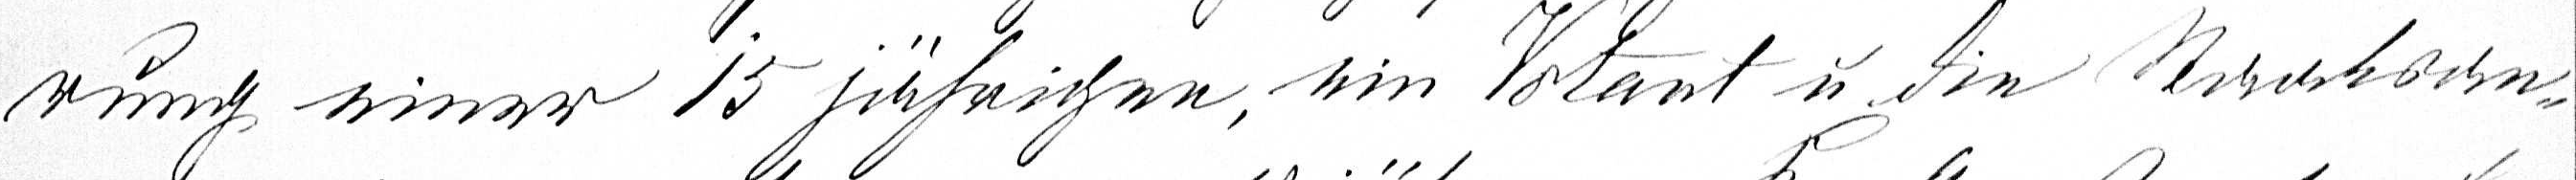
rung einer 15 jährigen, ein Votant u die Staatsan¬
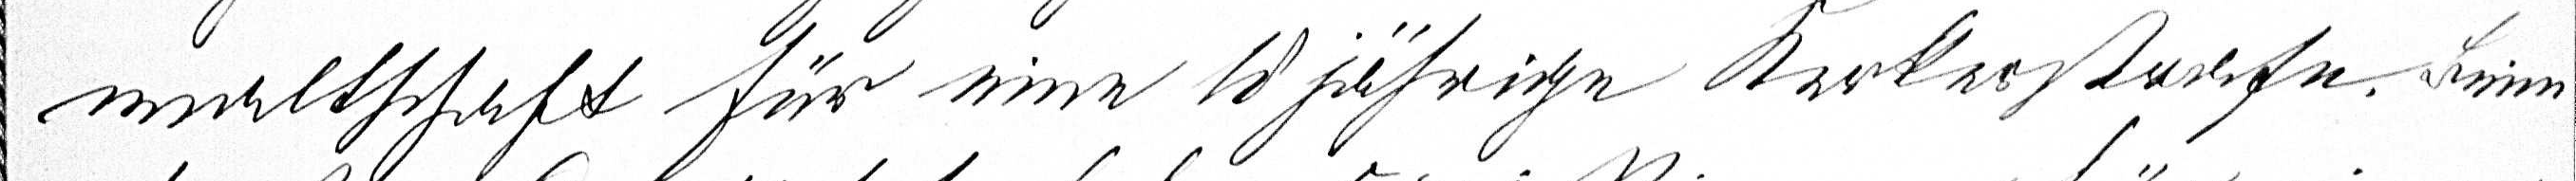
waltschaft für eine 18 jährige Kerkerstrafe. Beim
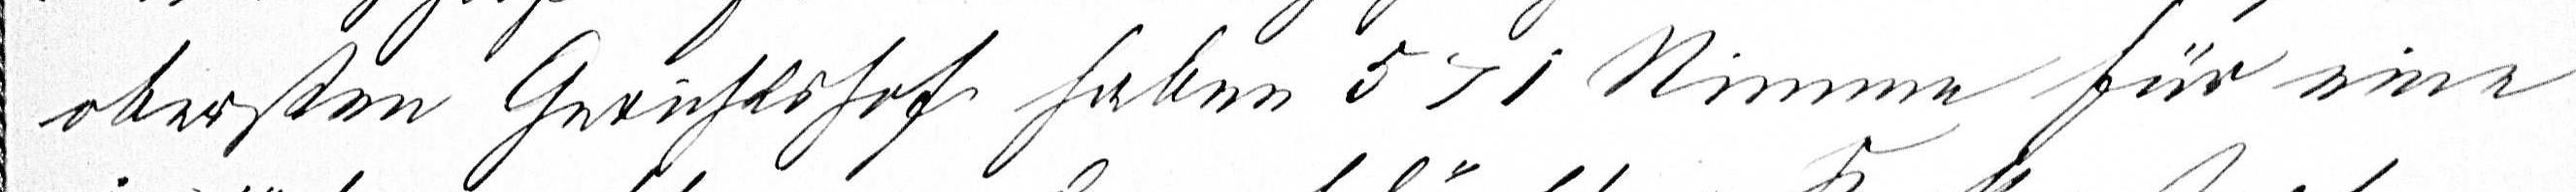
obersten Gerichtshof haben 5 > 1 Stimme für eine
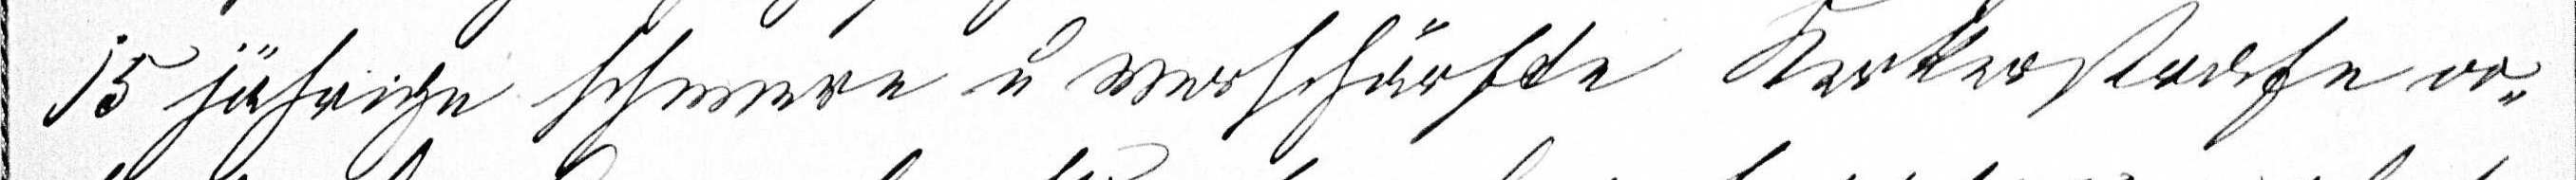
15 jährige schwere u verschärfte Kerkerstrafe vo¬
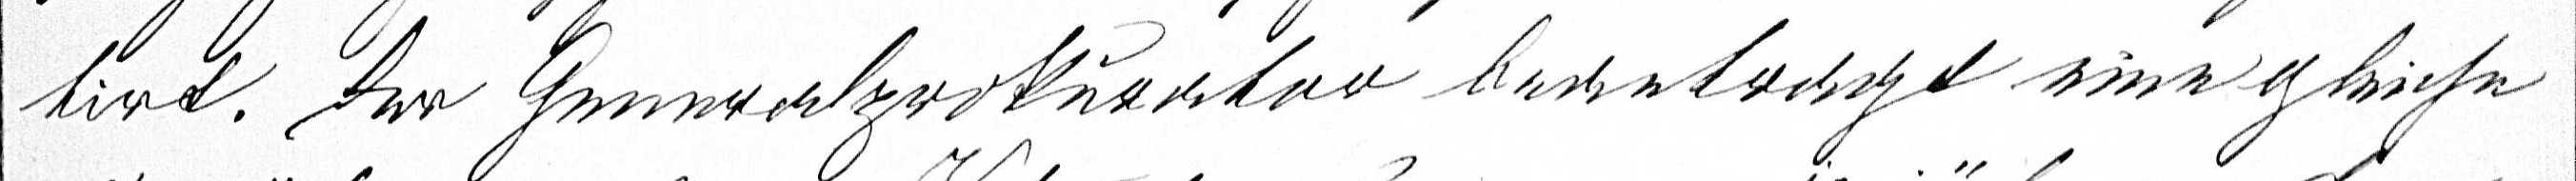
tirt. Der Generalprokurator beantragt eine gleiche
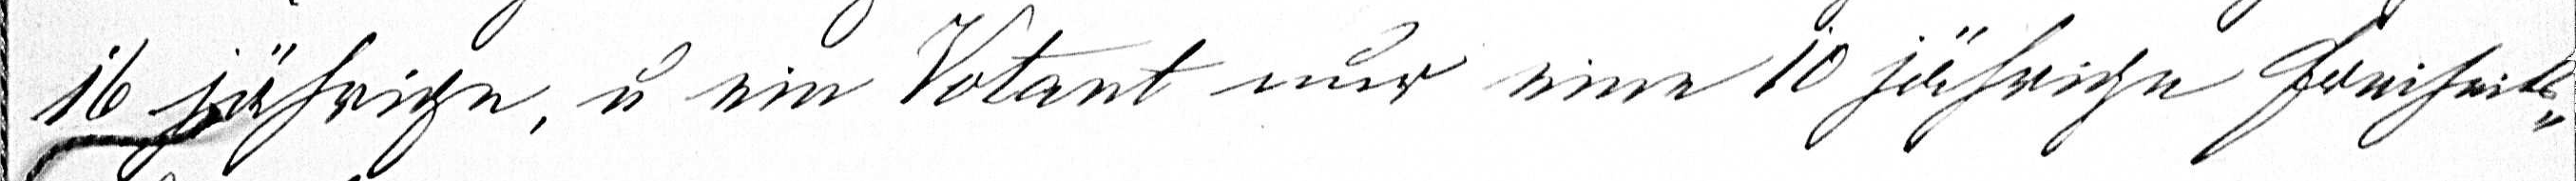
16jährige, u ein Votant nur eine 10 jährige Freiheits¬
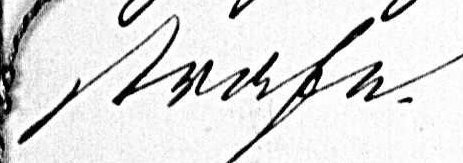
strafe.
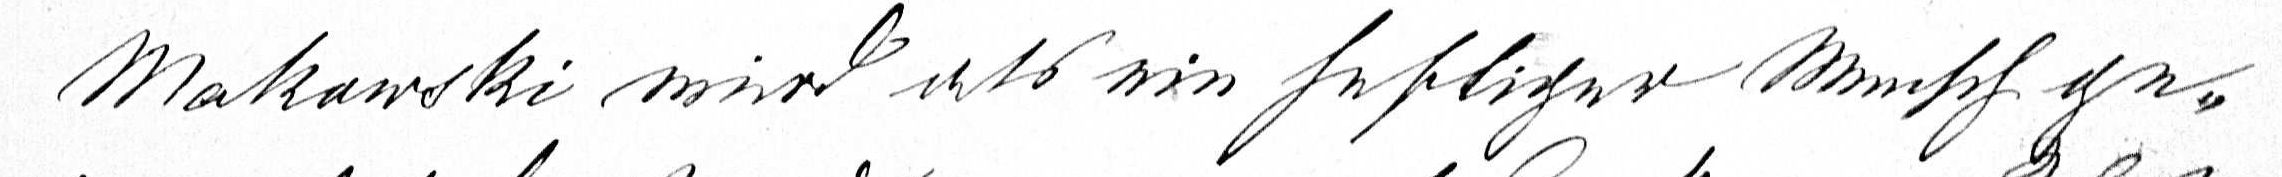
Makowski wird als ein heftiger Mensch ge¬
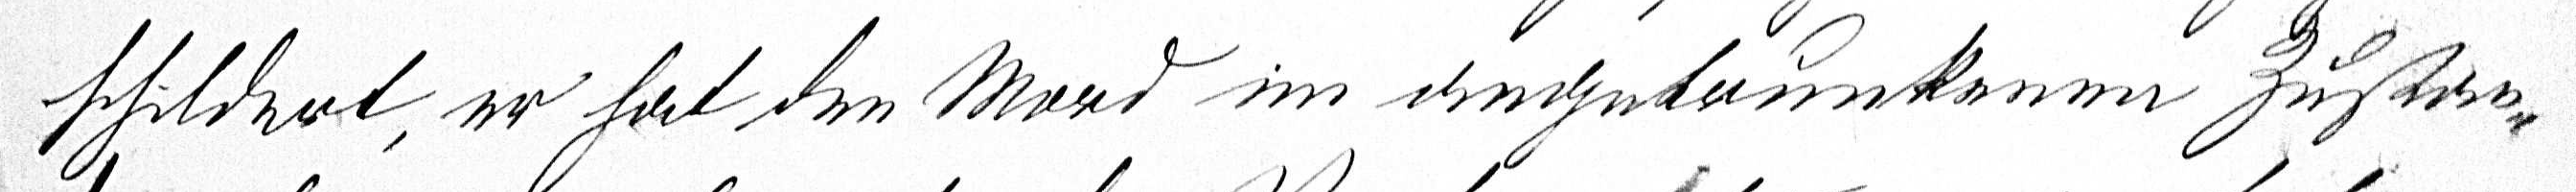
schildert, er hat den Mord im angetrunkenen Zustan¬
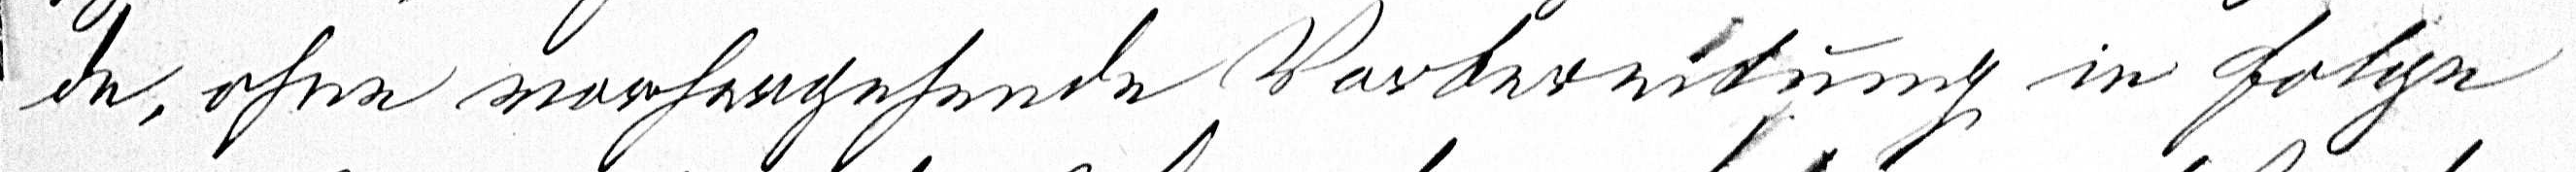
de, ohne vorhergehende Vorbereitung in Folge
